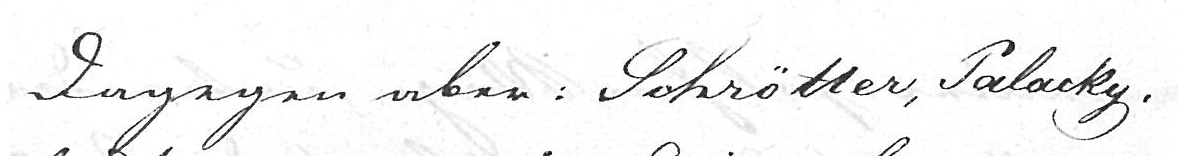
dagegen aber: Schrötter, Palacky,
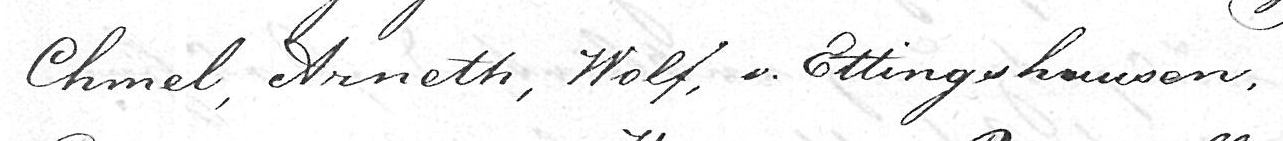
Chmel, Arneth, Wolf, v. Ettingshausen.
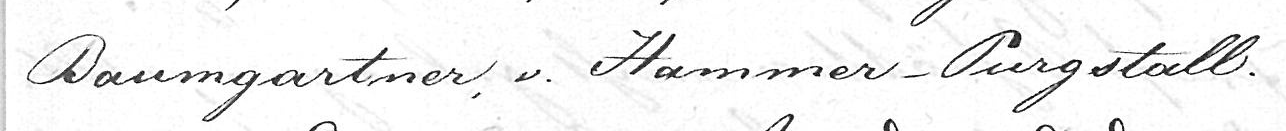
Baumgartner, v. Hammer-Purgstall.
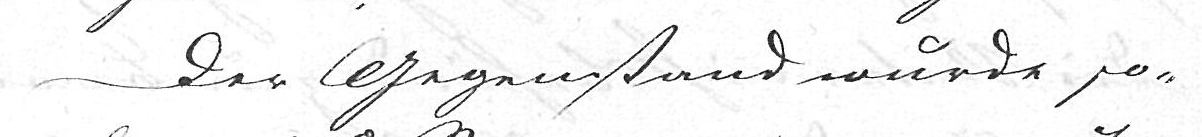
Der Gegenstand wurde so-
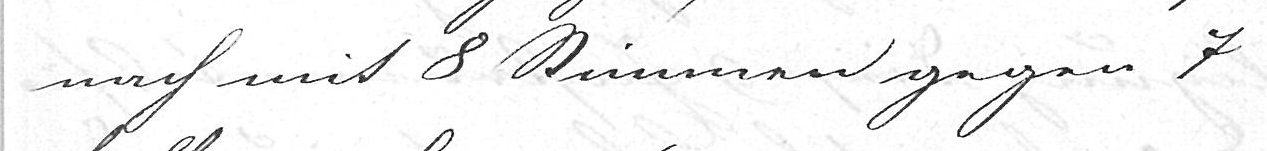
nach mit 8 Stimmen gegen 7
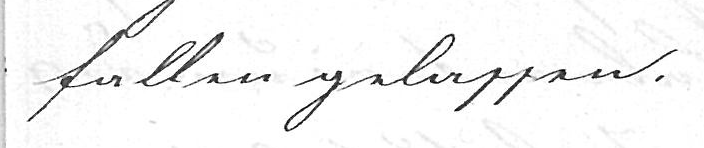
fallen gelassen.
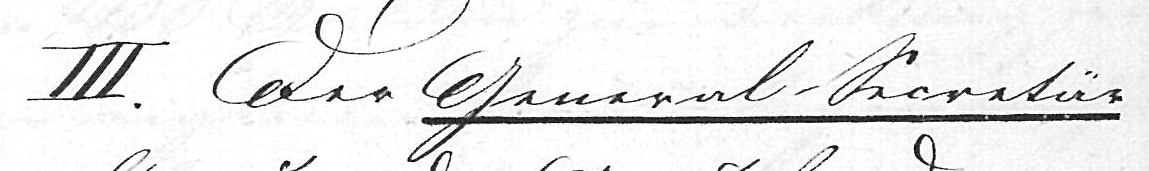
III. Die General-Secretär
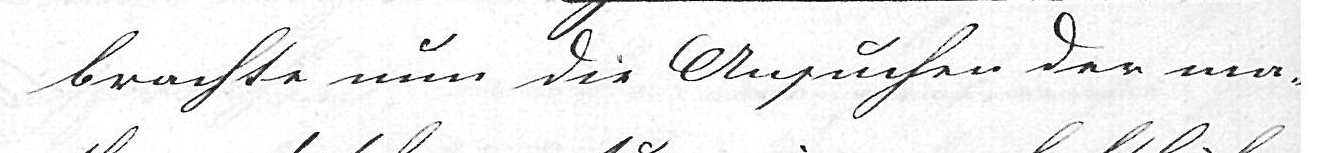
brachte nun die Ansuchen der ma-
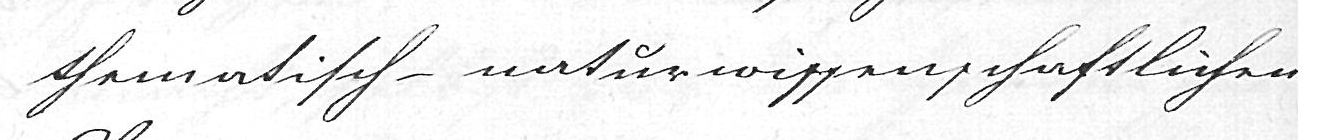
thematisch-naturwissenschaftlichen
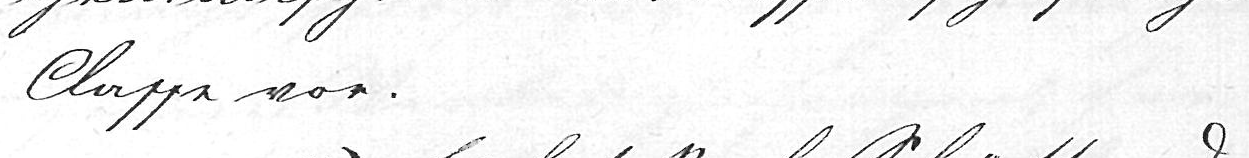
Classe vor.
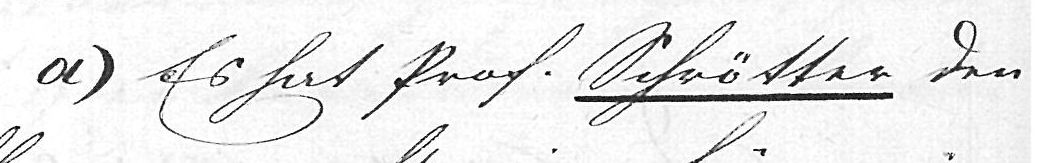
a) Es hat Prof. Schrötter den
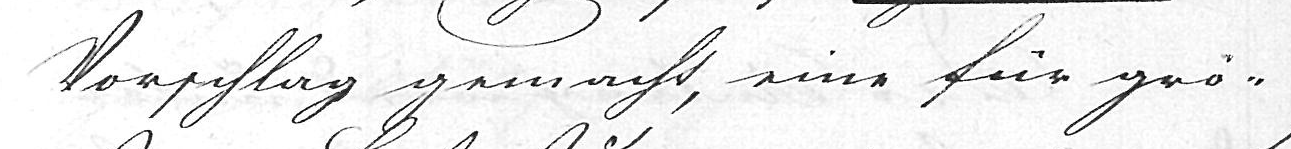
Vorschlag gemacht, eine für grö-
